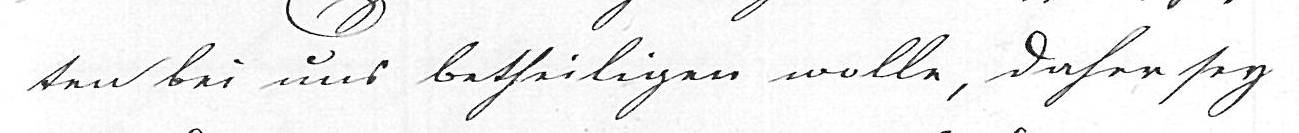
ten bei uns betheiligen wolle, daher sey
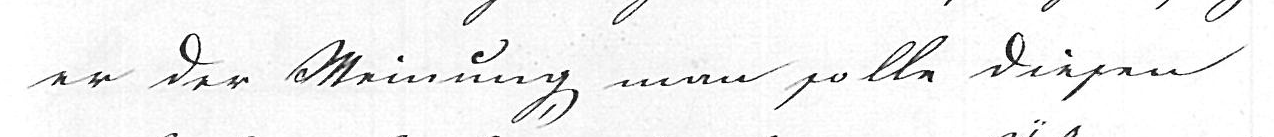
er der Meinung, man solle diesen
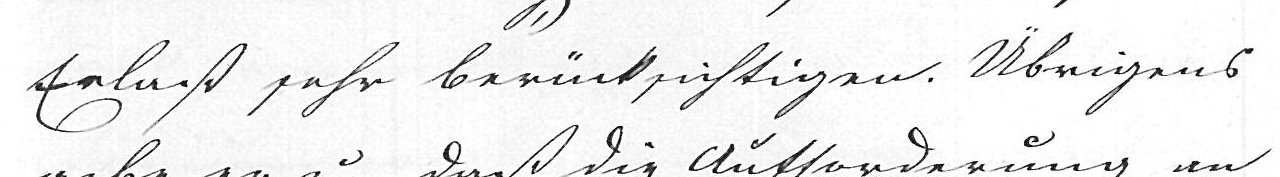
Erlaß sehr berücksichtigen. Übrigens
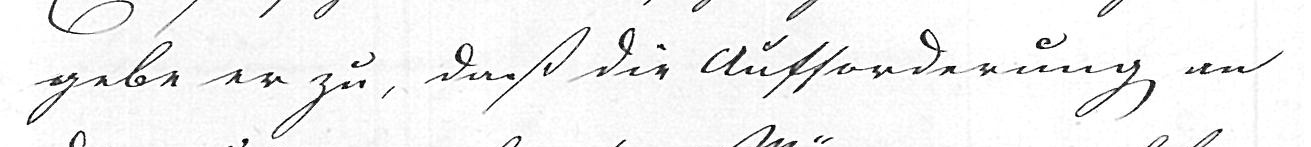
gebe er zu, daß die Anforderung an
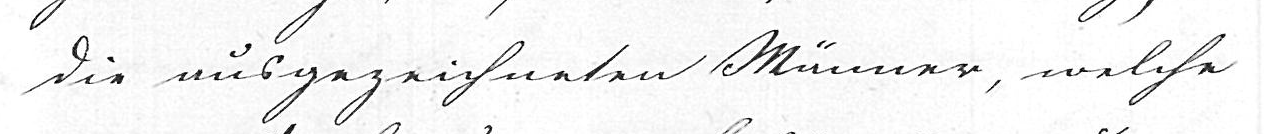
die ausgezeichneten Männer, welche
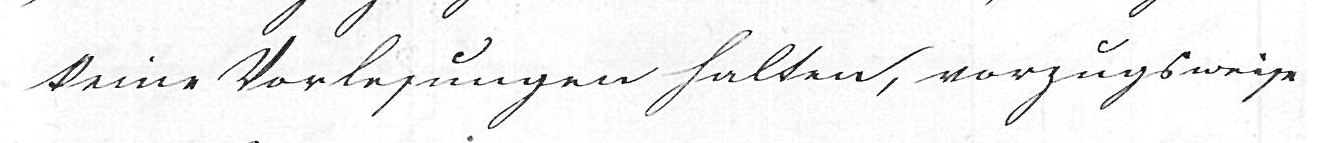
keine Vorlesungen halten, vorzugsweise
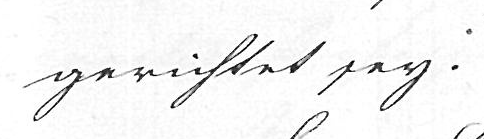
gerichtet sey.
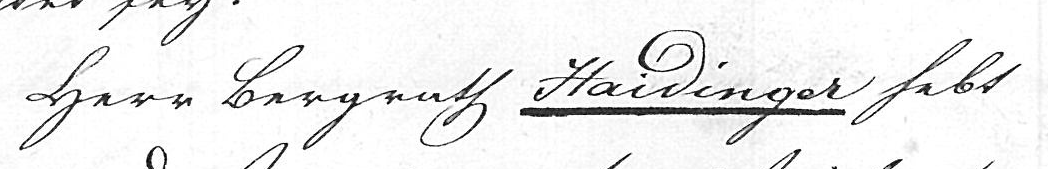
Herr Bergrath Haidinger hebt
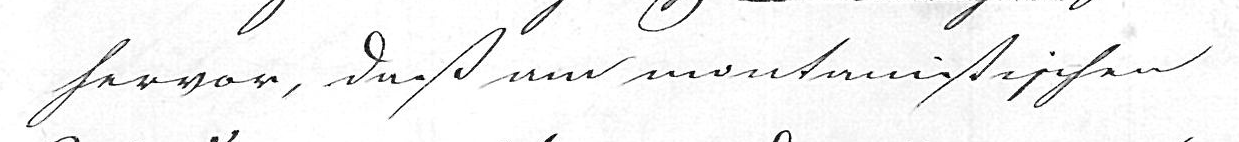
hervor, daß am montanistischen
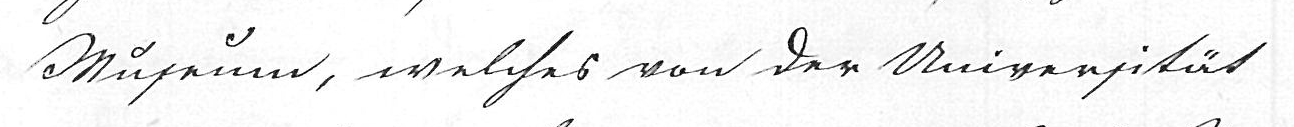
Museum, welches von der Universität
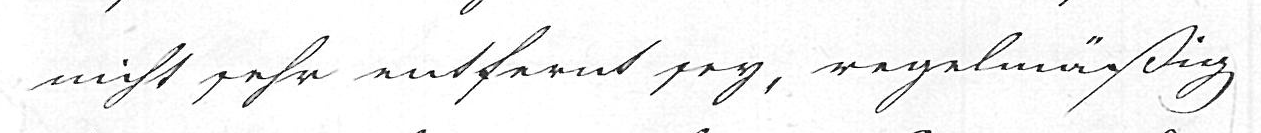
nicht sehr entfernt sey, regelmäßig
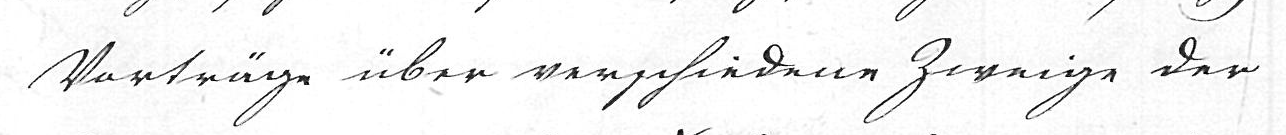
Vorträge über verschiedene Zweige der
